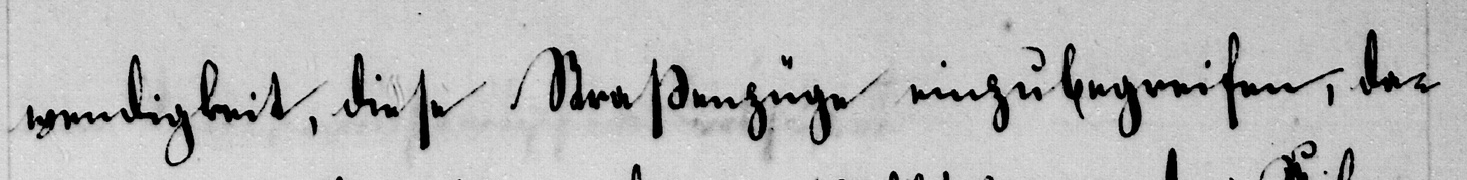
wendigkeit, diese Straßenzüge einzubegreifen, da¬
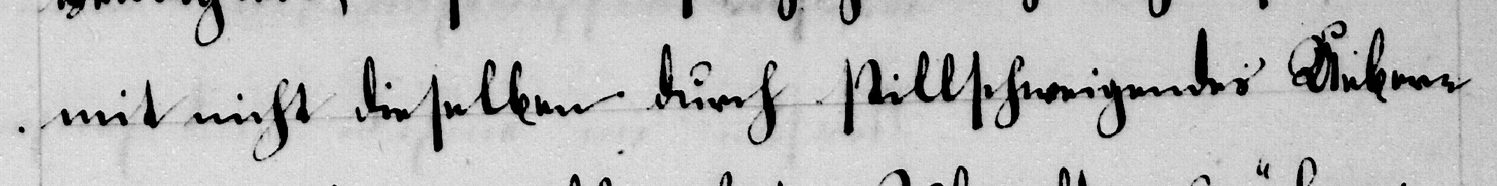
mit nicht dieselben durch stillschweigendes Ueber¬
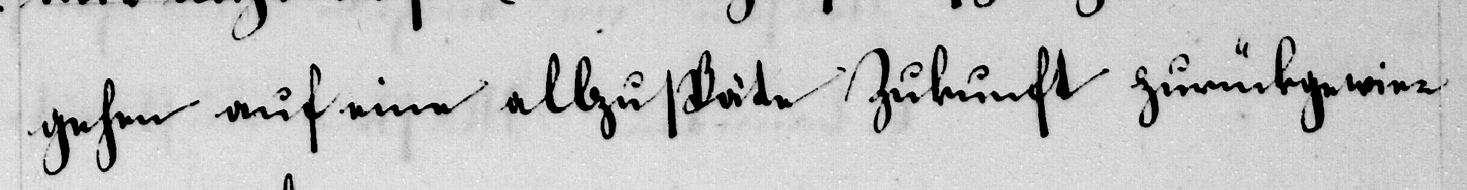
gehen auf eine allzuspäte Zukunft zurückgewie¬
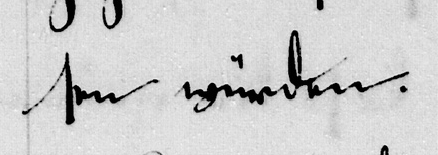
sen würden.
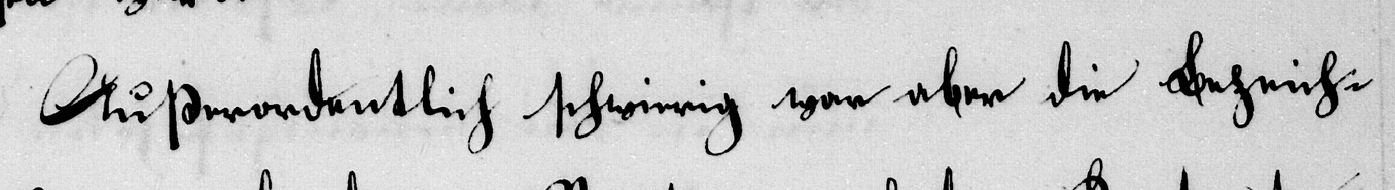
Außerordentlich schwierig war aber die Bezeich¬
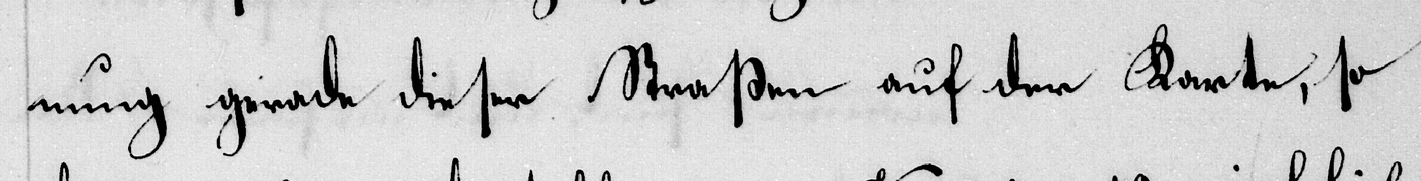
nung gerade dieser Straßen auf der Karte, so
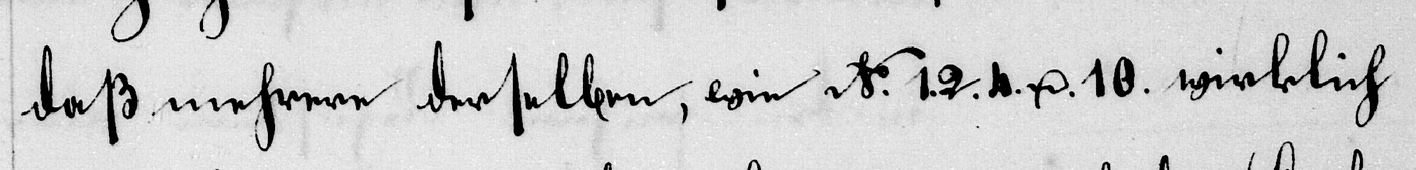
daß mehrere derselben, wie N°. 1. 2. 4. u. 10. wirklich
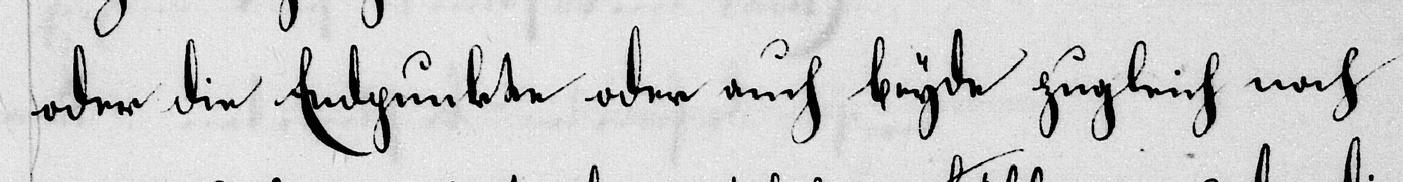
oder die Endpunkte oder auch beyde zugleich noch
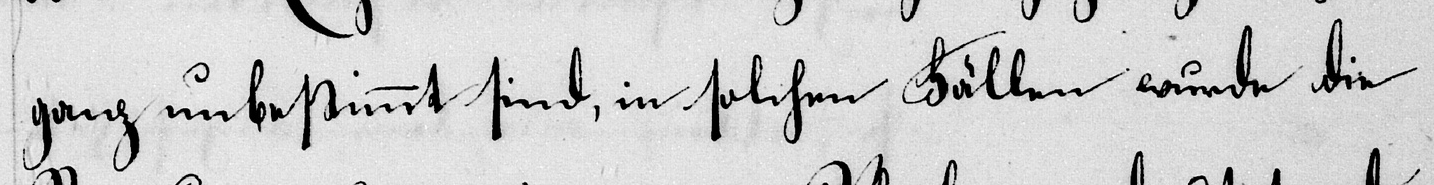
ganz unbestimmt sind, in solchen Fällen wurde die
